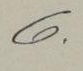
5
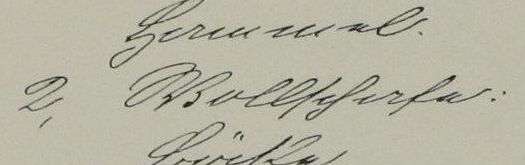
2. Wollschafe
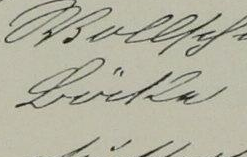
Böcke
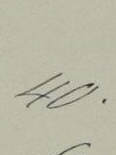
40
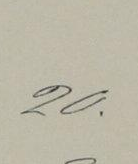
20
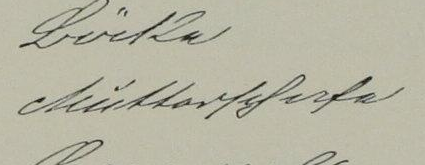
Mutterschafe
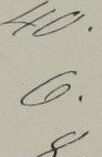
6
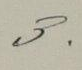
3
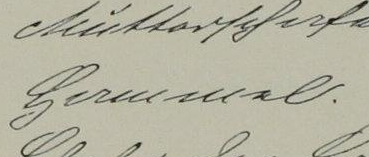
Hammel
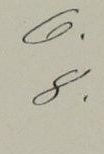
8
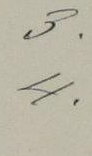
4
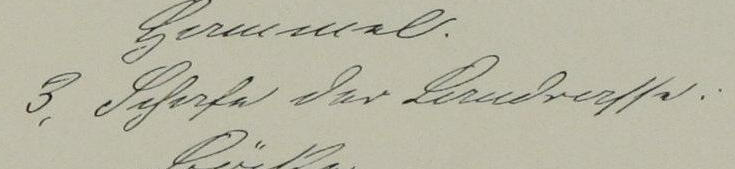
3. Schafe der Landrasse
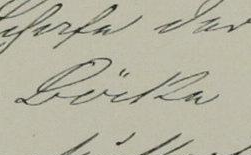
Böcke
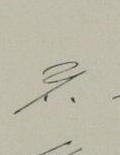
7
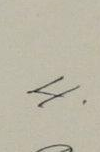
4
